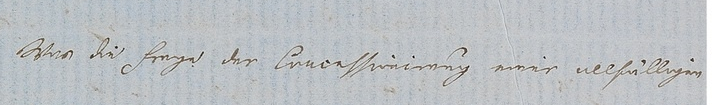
Was die Frage der Concessionirung einer allfälligen
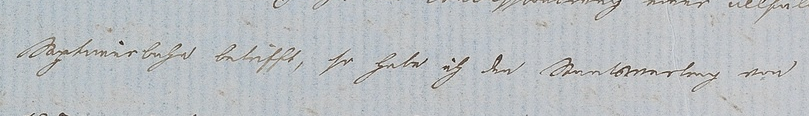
Septimerbahn betrifft, so habe ich den Staatsvertrag von
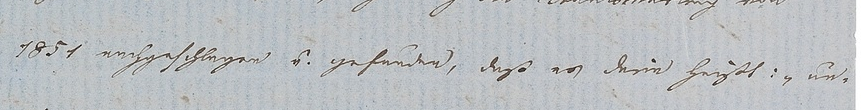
1851 nachgeschlagen u. gefunden, daß es darin heißt: «un-
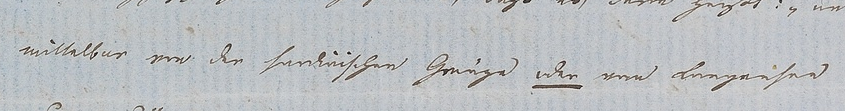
mittelbar von der sardinischen Gränze oder vom Langensee
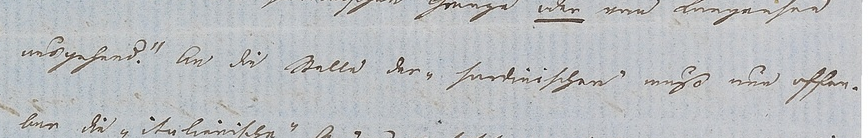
ausgehend.» An die Stelle der «sardinischen» muß nun offen-
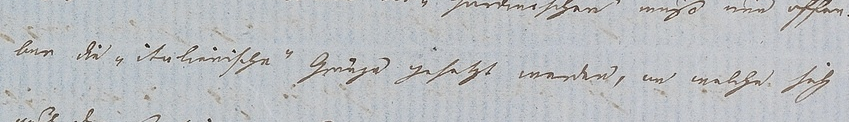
bar die «italienische» Gränze gesetzt werden, an welche sich
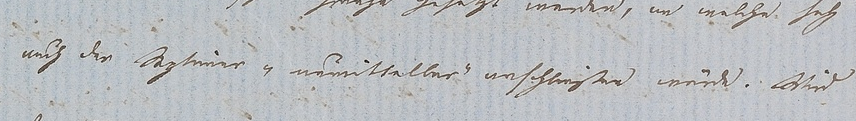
auch der Septimer «unmittelbar» anschließen würde. Wird
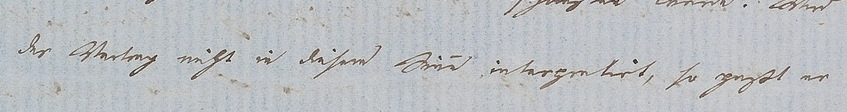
der Vertrag nicht in diesem Sinne interpretirt, so paßt er
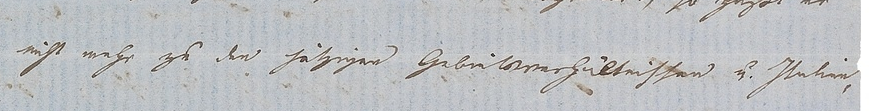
nicht mehr zu den jetzigen Gebietsverhältnissen u. Italien,
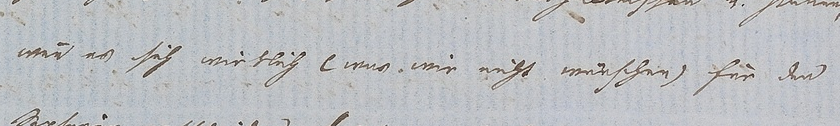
wenn es sich wirklich (was wir nicht wünschen) für den
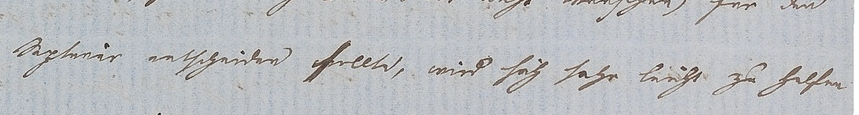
Septimer entscheiden sollte, wird sich sehr leicht zu helfen
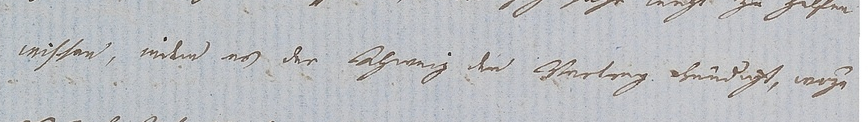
wissen, indem es der Schweiz den Vertrag kündigt, wozu
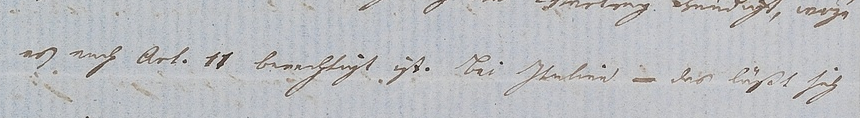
es nach Art. 11 berechtigt ist. Bei Italien – das läßt sich
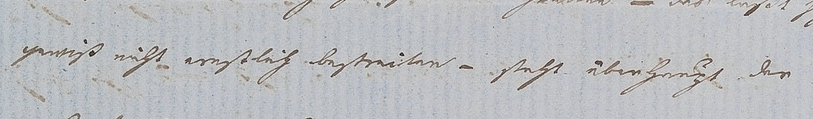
gewiß nicht ernstlich bestreiten – steht überhaupt der
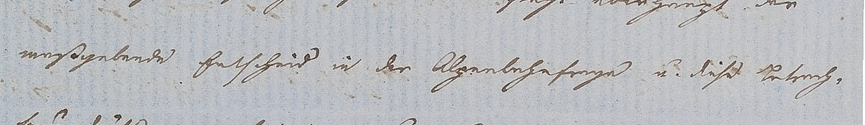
maßgebende Entscheid in der Alpenbahnfrage u. diese Betrach-
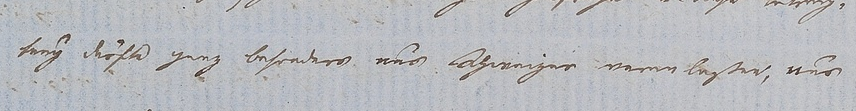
tung dürfte ganz besonders uns Schweizer veranlaßen, uns
